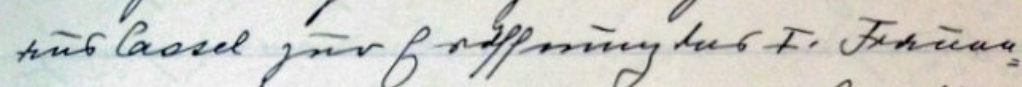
aus Cassel zur Eröffnung des I. Frauen
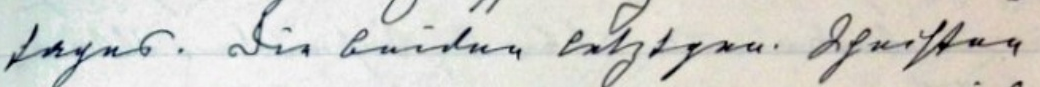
Frauentages. Die beiden letzten Schriften
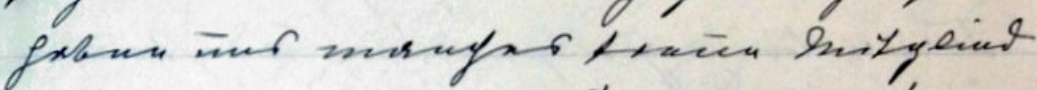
Schriften haben uns manches treue Mitglied
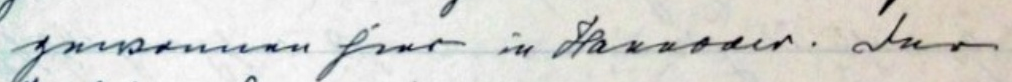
gewonnen hier in Hannover. Der
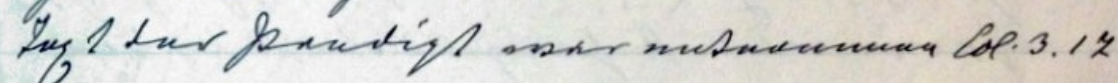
Text der Predigt war entnommen Col 3.17.
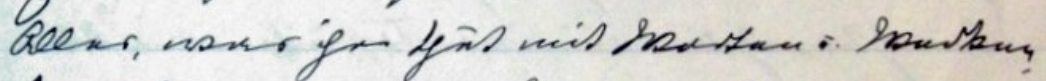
Alles, was ihr thut mit Worten u. Werken,
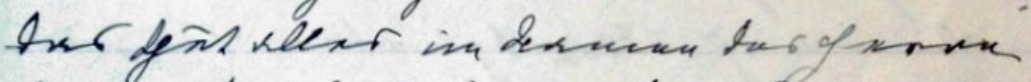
das thut alles im Namen des Herrn
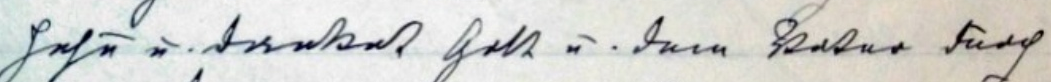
Jesu u. danket Gott u, dem Vater durch
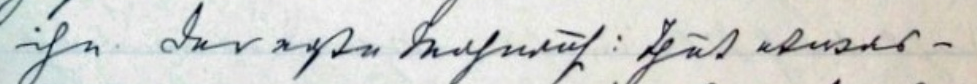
ihn. Der erste Weheruf: Thut etwas –
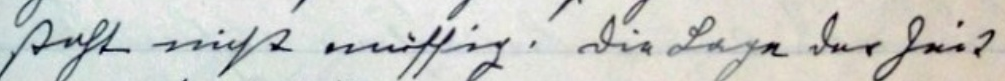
steht nicht müssig. Die Lage der Zeit
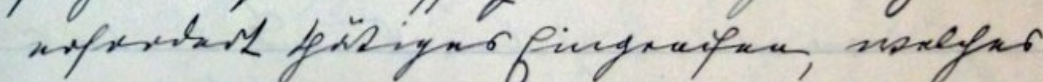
erfordert thätiges Eingreifen, welches
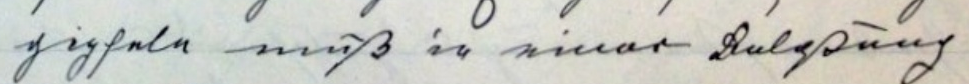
gipfeln muß in einer Belastung
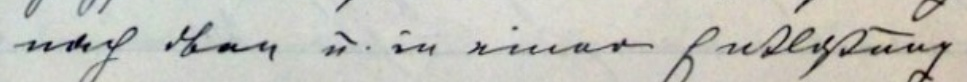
nach oben u. in einer Entlastung
